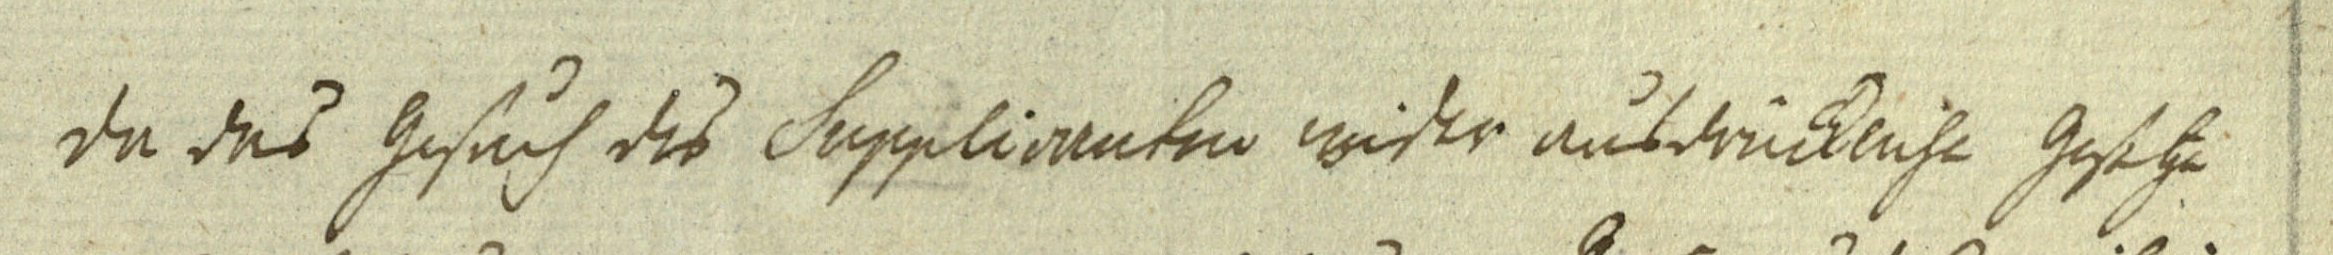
da des Gesuch des Supplicanten wider ausdrückliche Gesetze
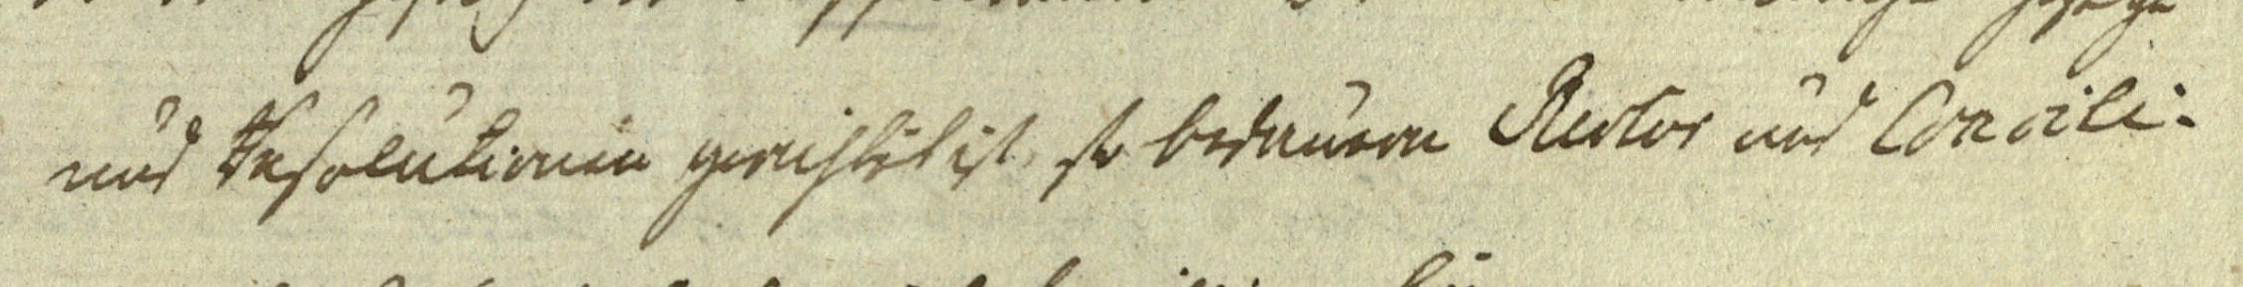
und Resolutionen gerichtet ist so bedauern Rector und Concili¬
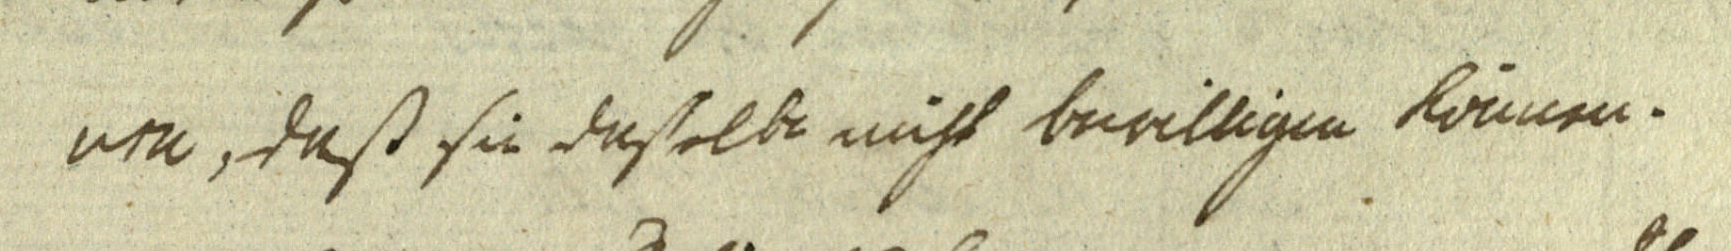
um, daß sie dasselbe nicht bewilligen können.
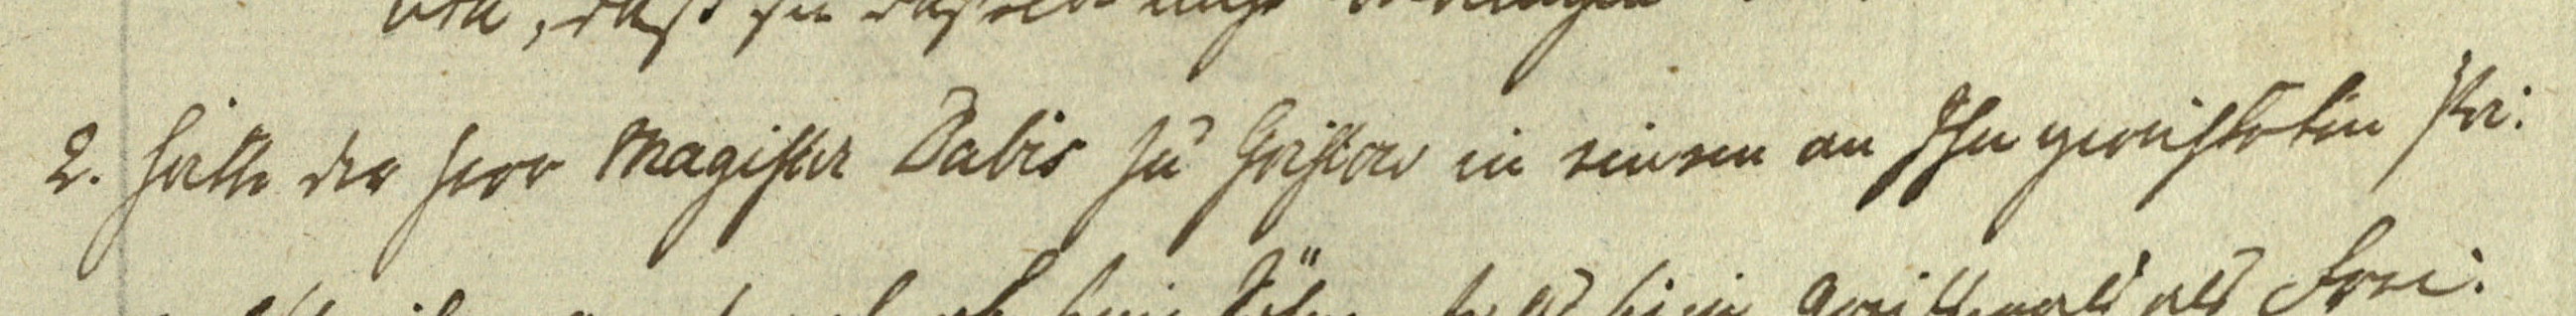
2. Hätte der Herr Magister Dabis zu Gristow in einem an Ihn gerichteten Pri¬
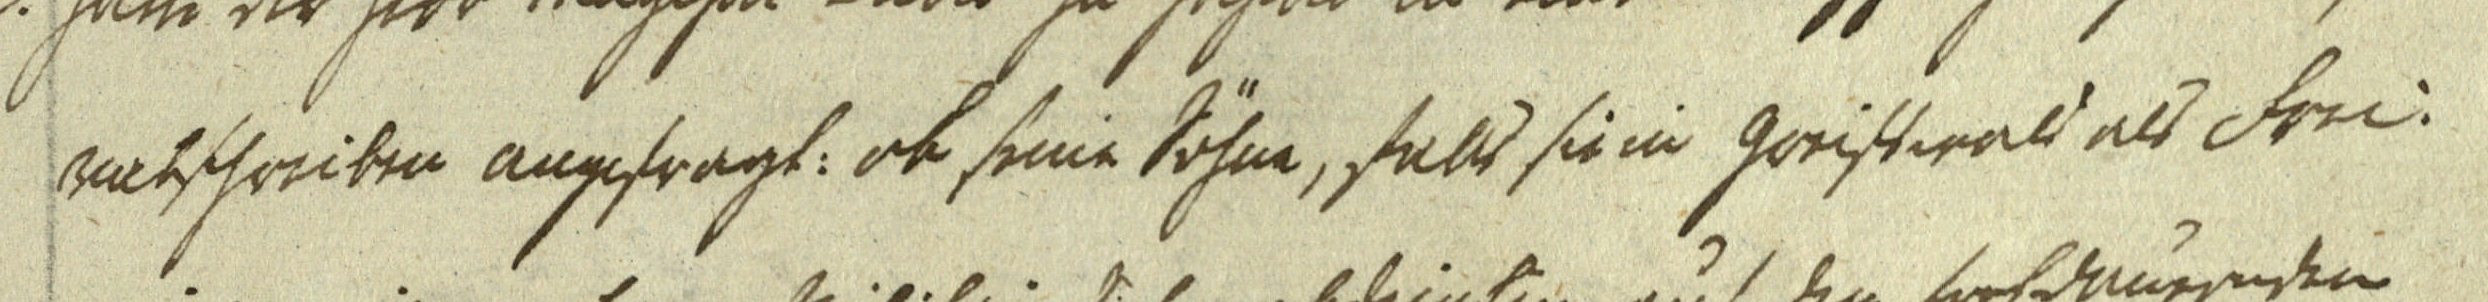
vatschreiben angefragt: ob seine Söhne, falls sie in Greifswald als Frei¬
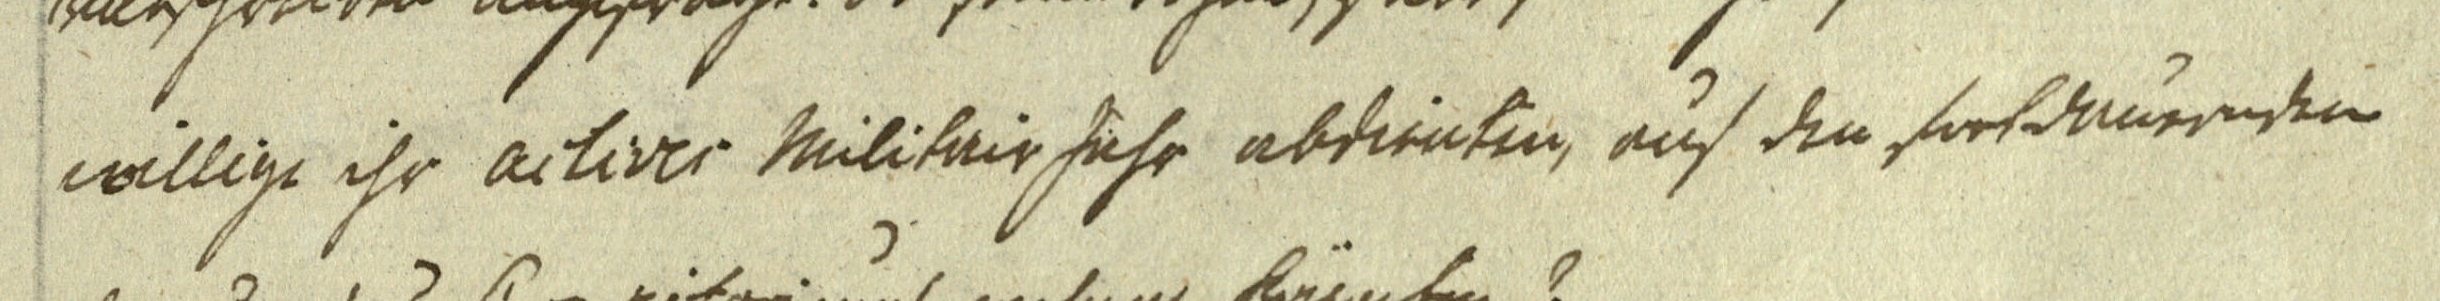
willige ihr actives MilitairJahr abdienten, auf den fortdauernden
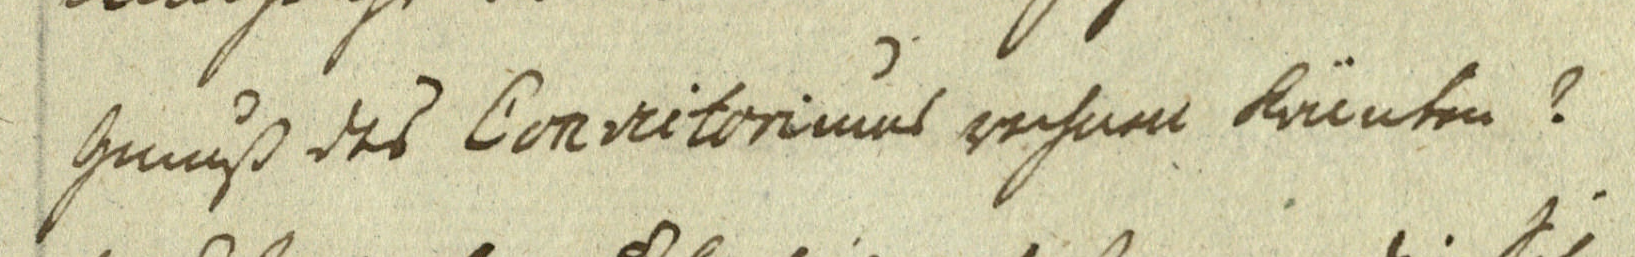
Genuß des Convictoriums rechnen könnten?
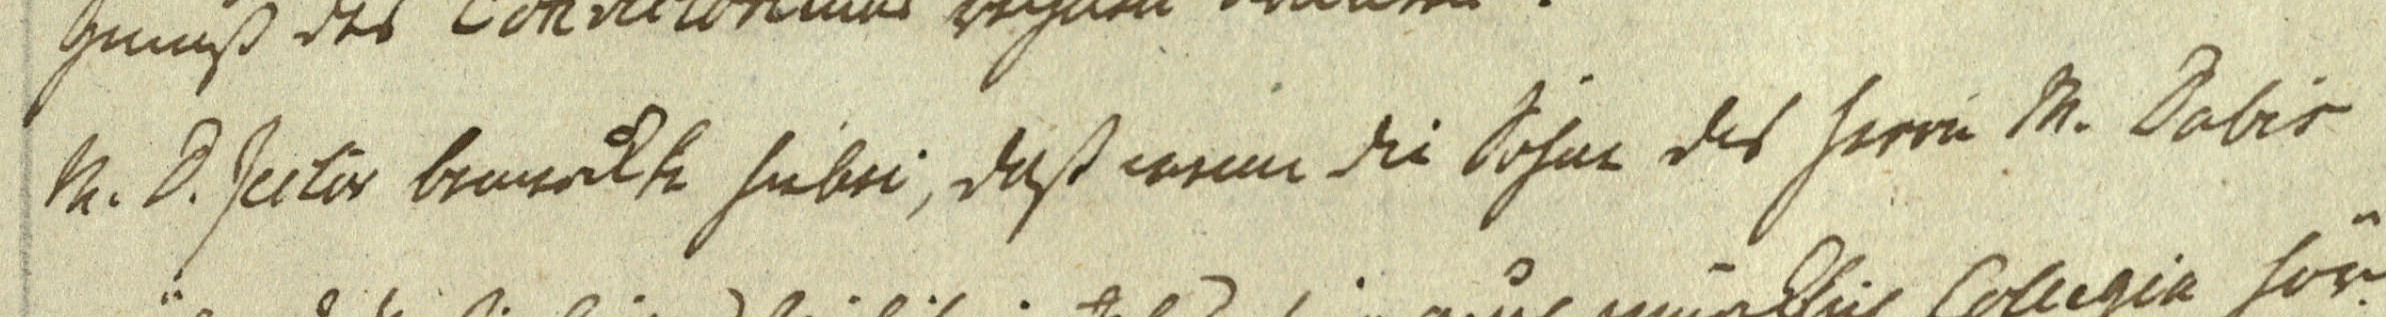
M. D. Rector bemerkte haben, daß wenn die Söhne des Herrn M. Dabis
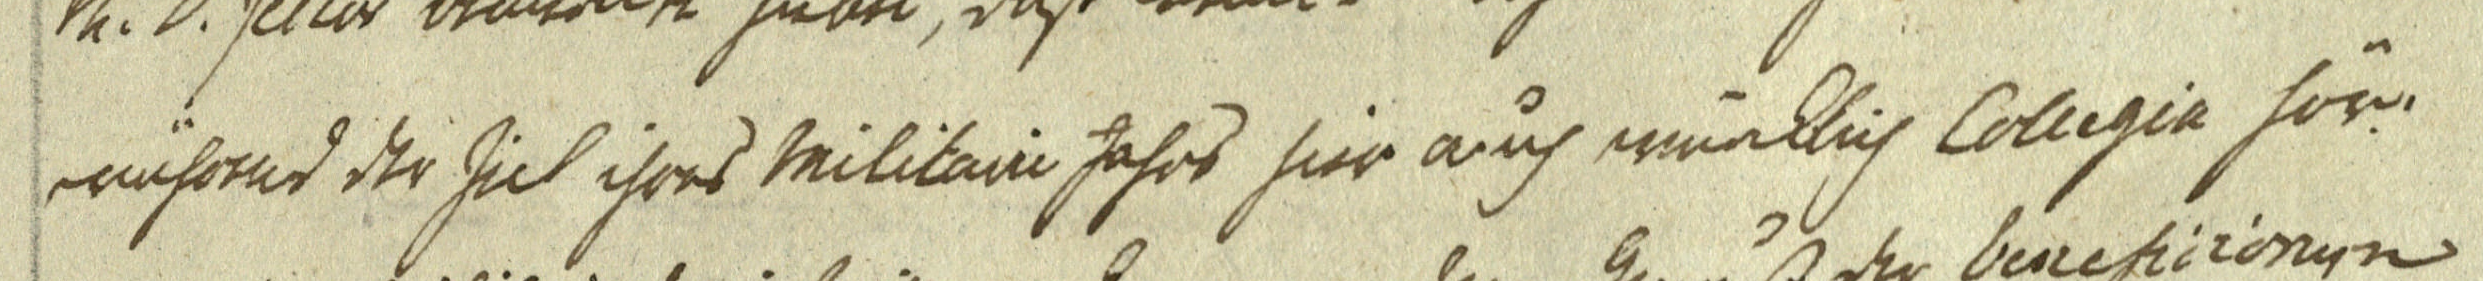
während der Zeit ihres MilitaireJahrs hier auch würcklich Collegia hör¬
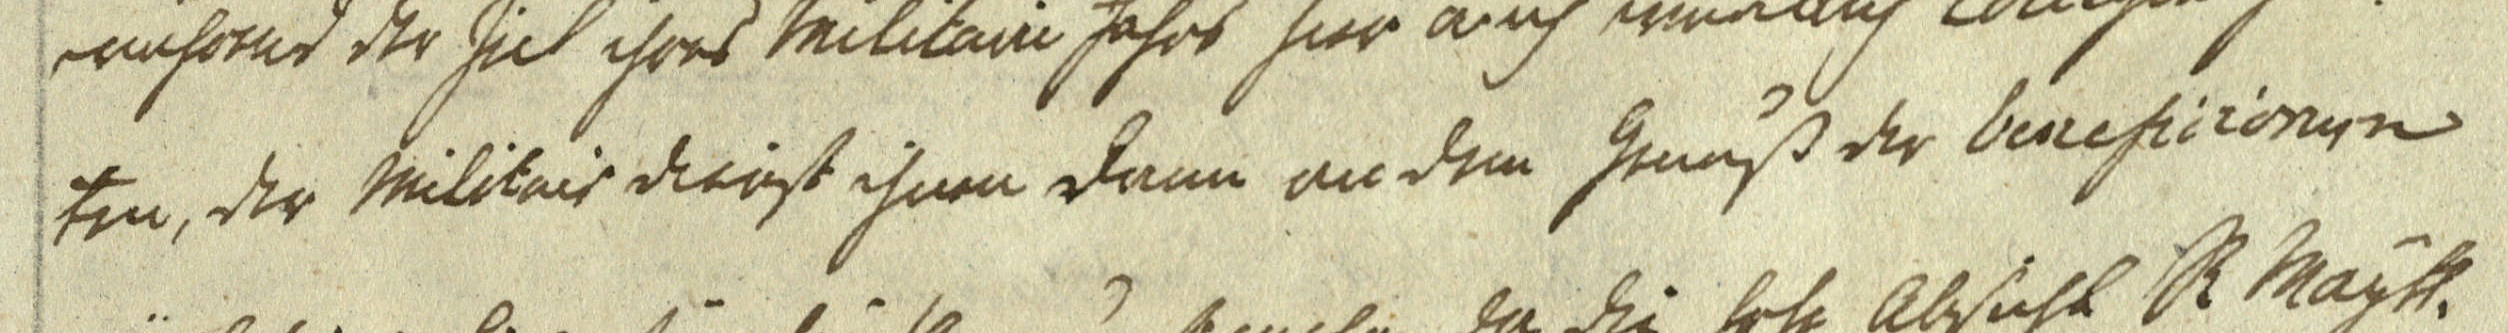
ten, der Militair dienst ihnen dann an dem Genuß der beneficiorum
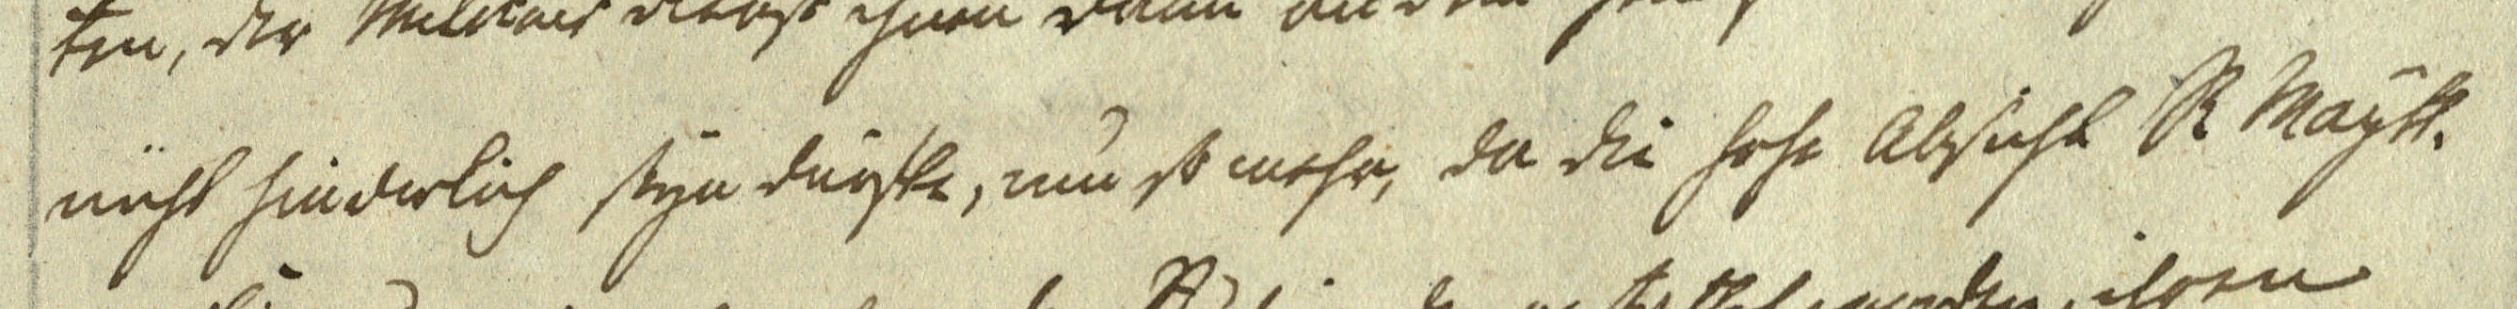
nicht hinderlich seÿn dürfte, um so mehr, da die hohe Absicht Sr Maÿtt.
